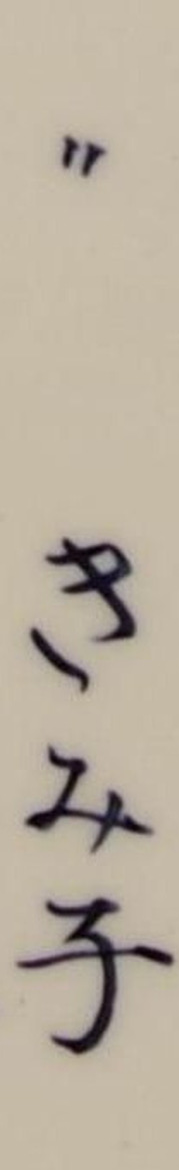きみ子
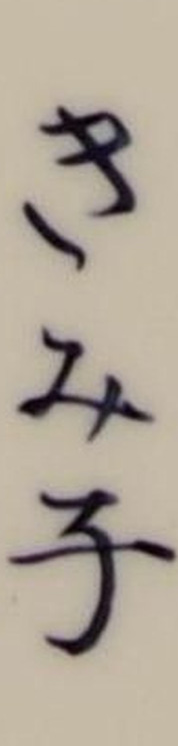きみ子
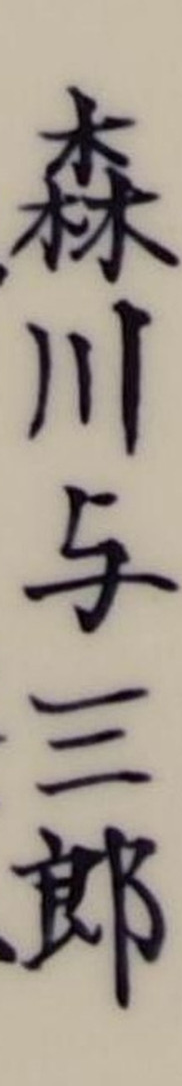森川与三郎
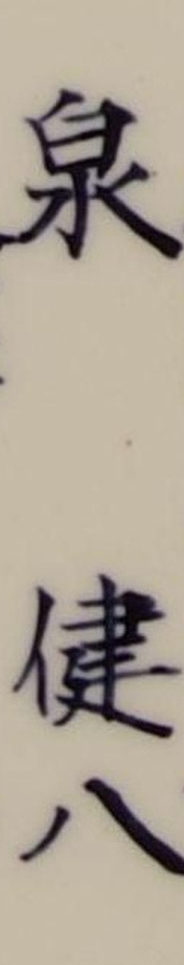泉健八
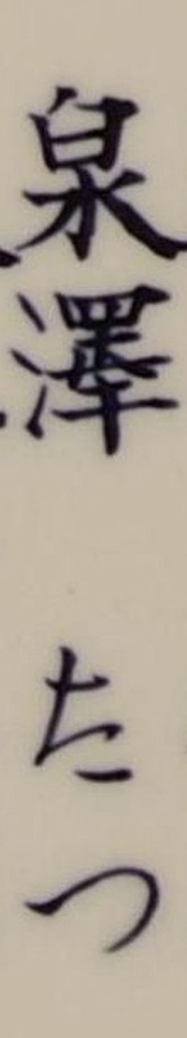泉澤たつ
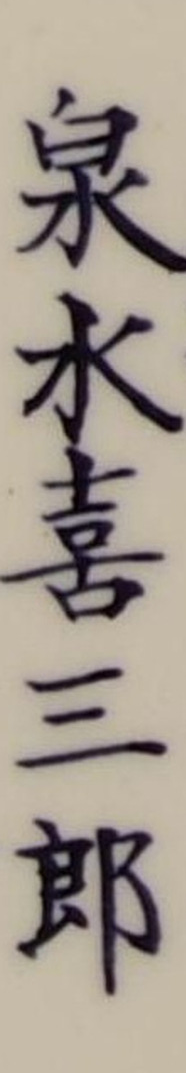泉水喜三郎

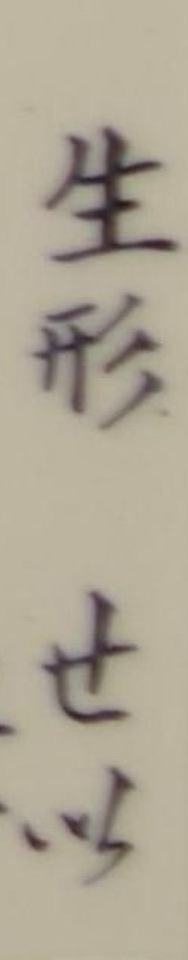生形せい
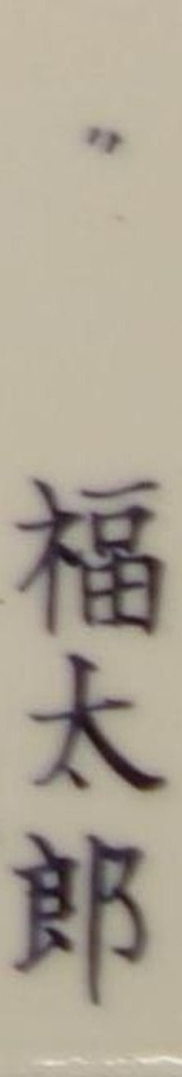福太郎
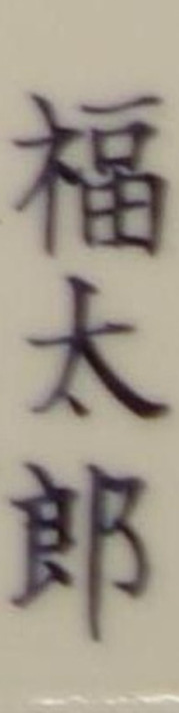福太郎
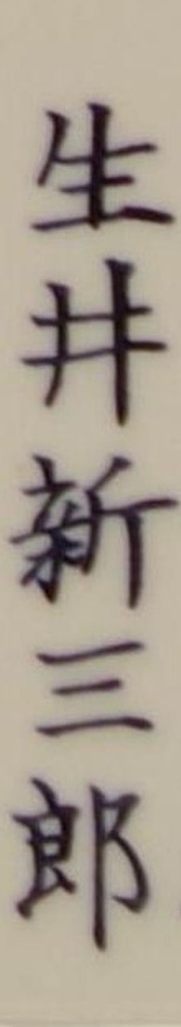生井新三郎
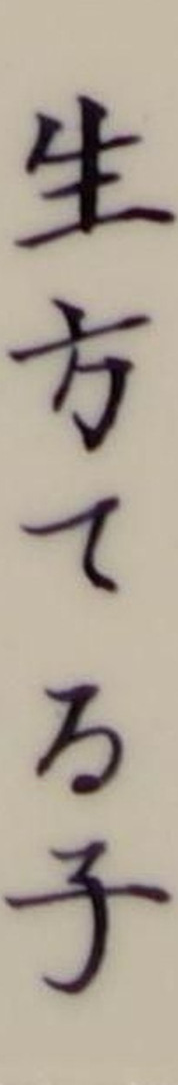生方てる子
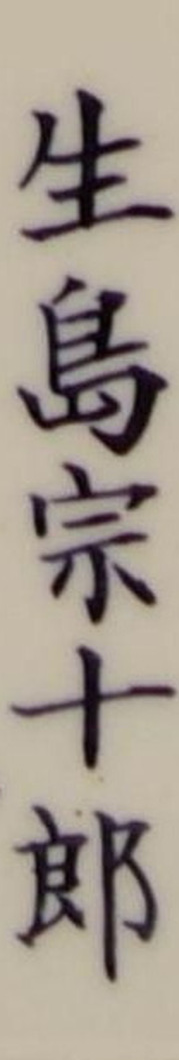生島宗十郎
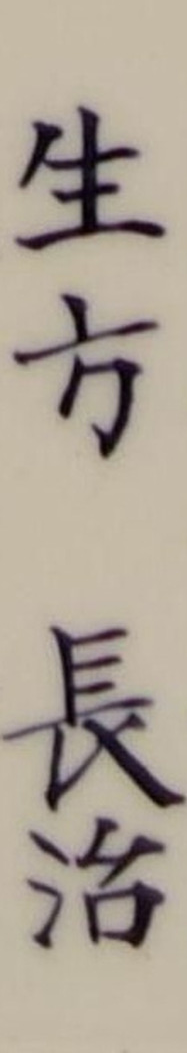生方長治
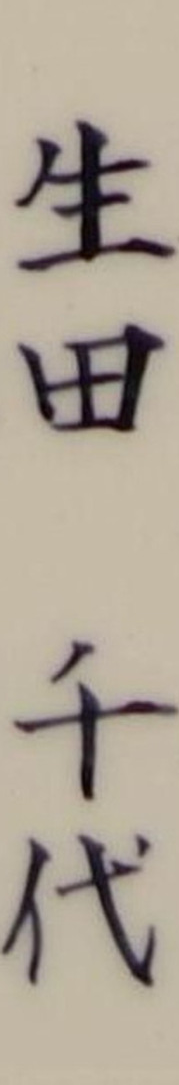生田千代
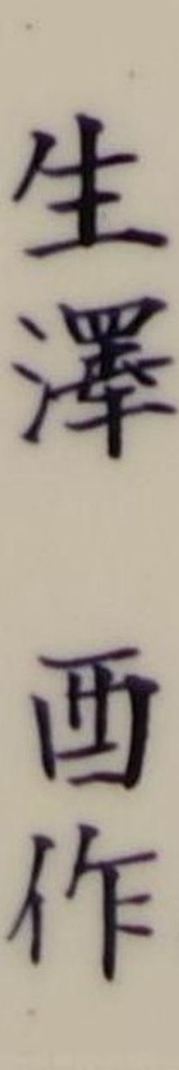生澤酉作
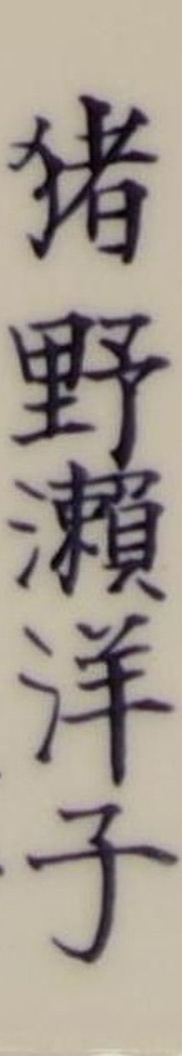猪野瀬洋子
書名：M~S
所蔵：高野山金剛峯寺
